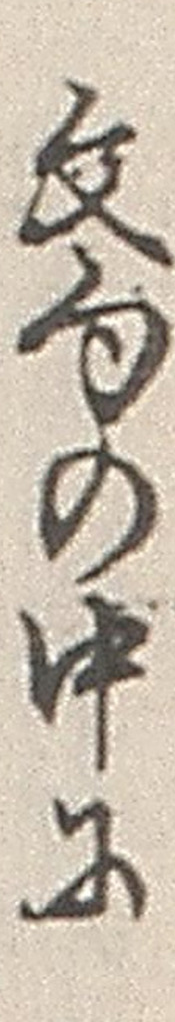文句の中に
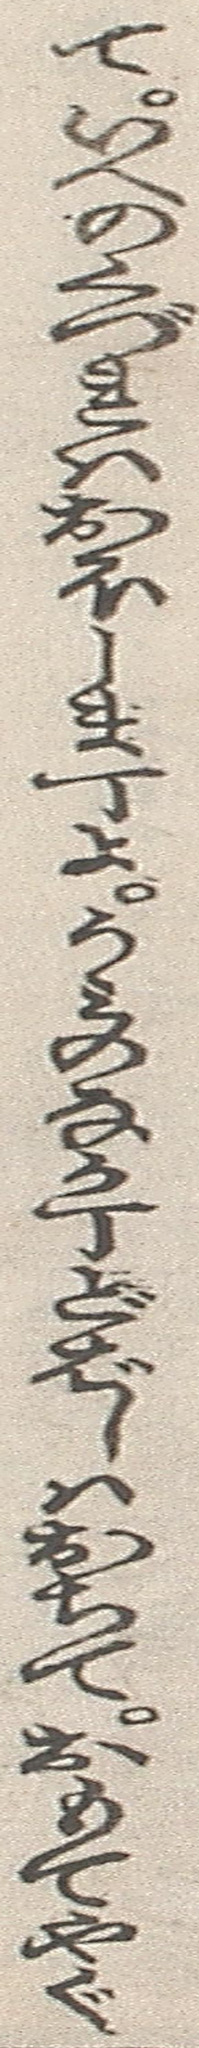て。いへのくづれハおほしま丁よ。うミのなか丁どばしハおちて。おもてやぐ
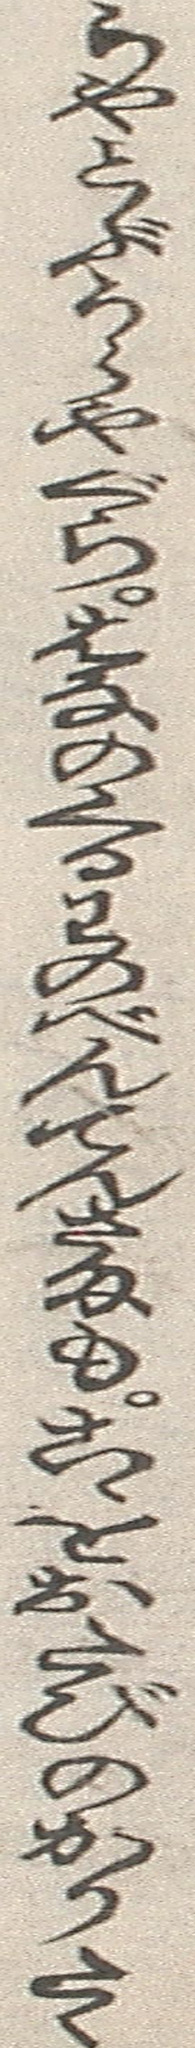らやとぶうらやぐら。はなのくるわのべんてんさまも。こゝをおたびのかりたく
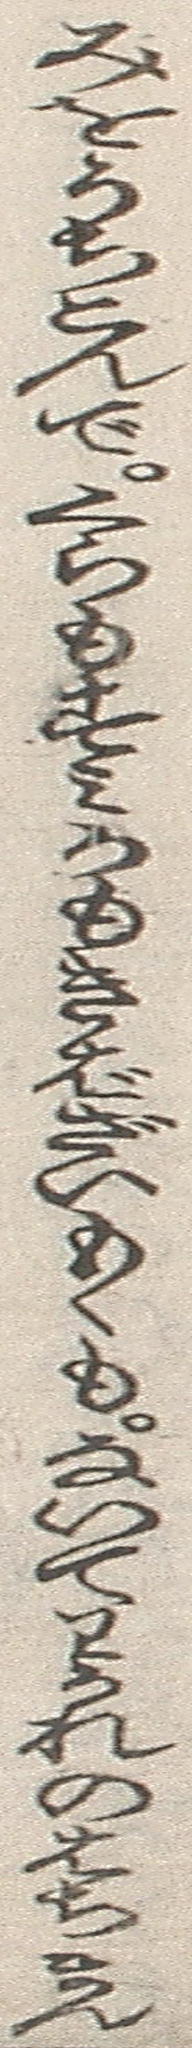みをうちこんで。くらもすミかもきばざいもくも。なおいてわかれのはちまん
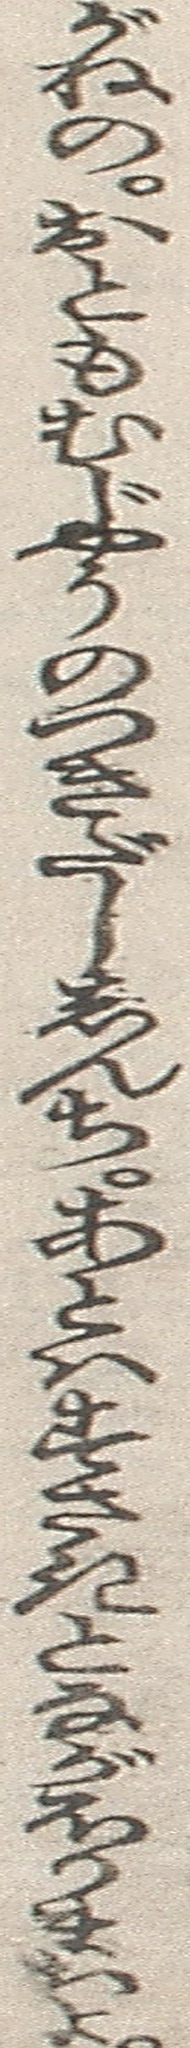がねの。おともむじやうのつきだしんち。あとハすさきとながほりまいよ。
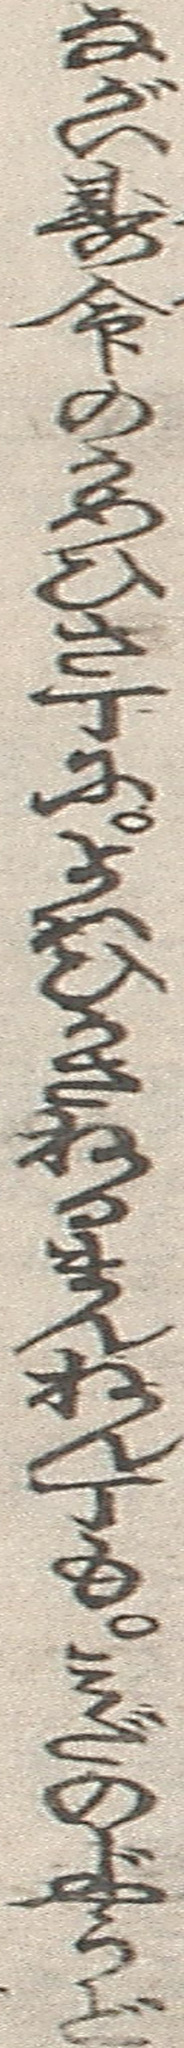ながい寿命のかめひさ丁に。よハひかさねるまんねん丁も。ミだのじやうど
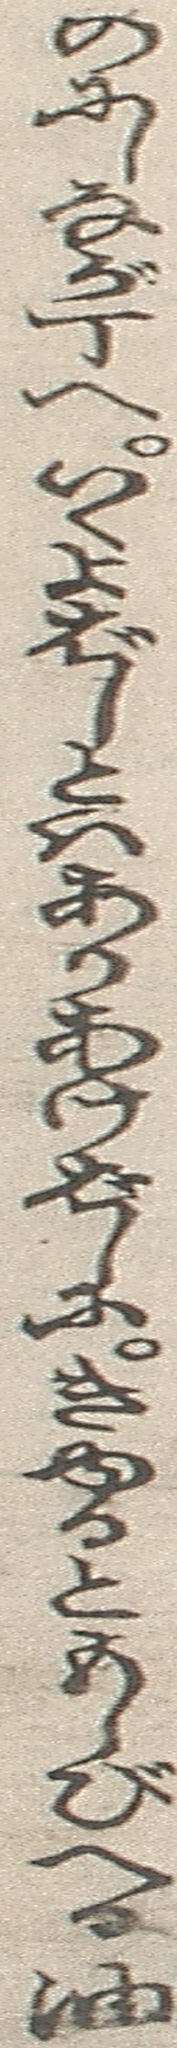のにしなが丁。いくよばしとハありあけばしに。きゆるともしびへる油

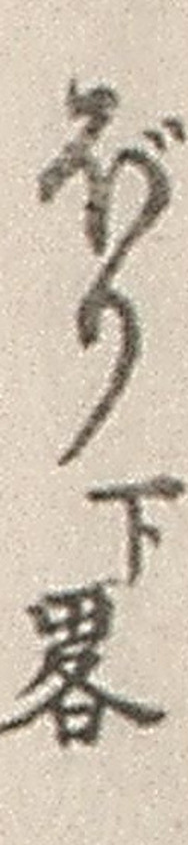ぼり下略
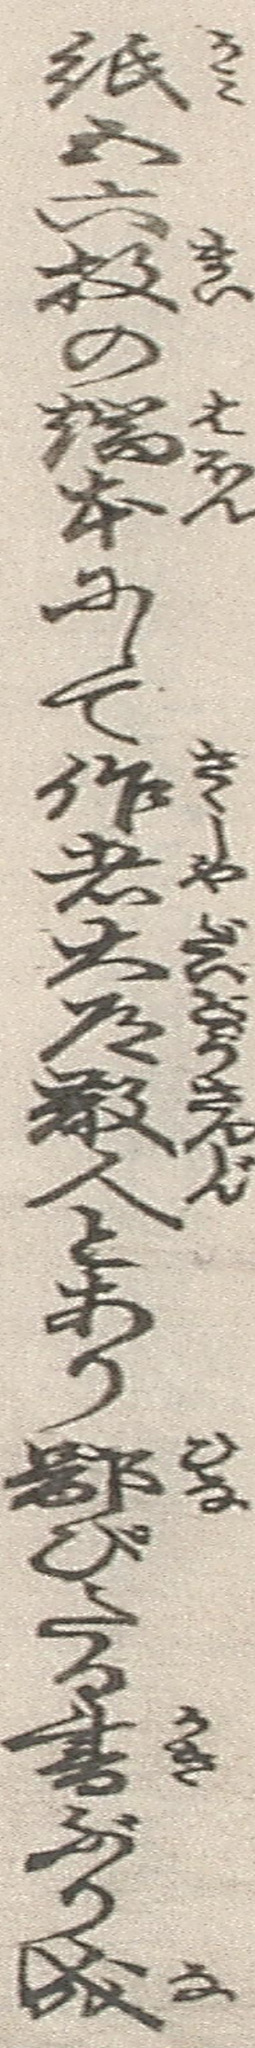紙ハ六枚の端本にて作者大道散人とあり鄙びたる書ぶり成
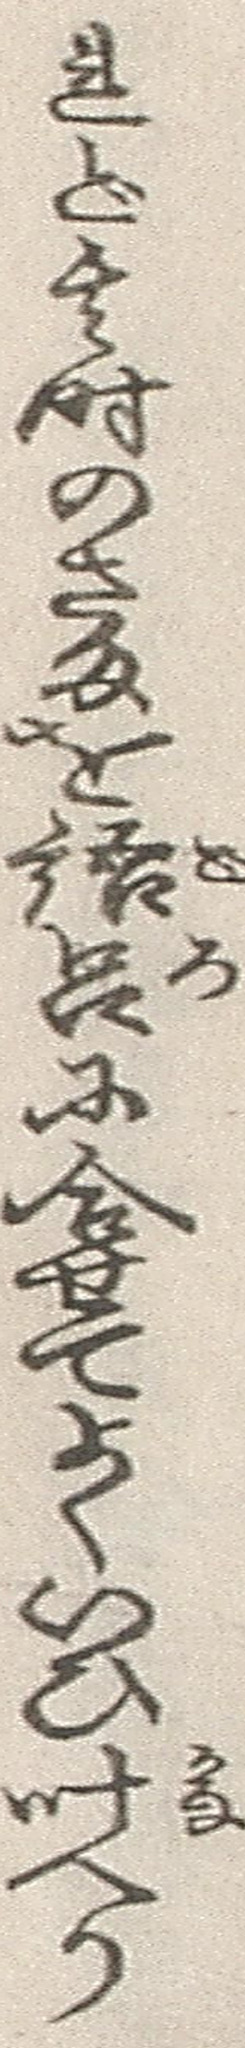れど其時のさまを語呂に合せてよくいひ叶へり
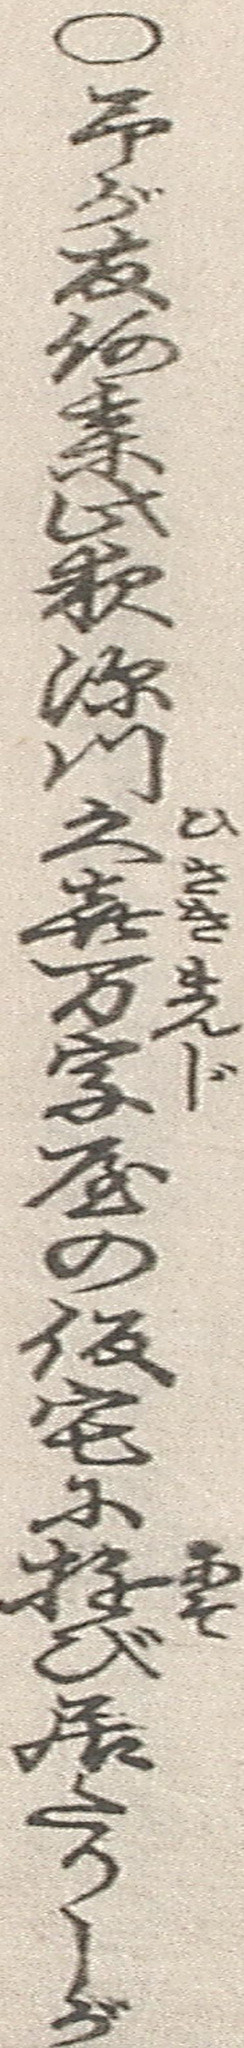◯予が友何某此夜深川久喜万字屋の仮宅に遊び居たりしが
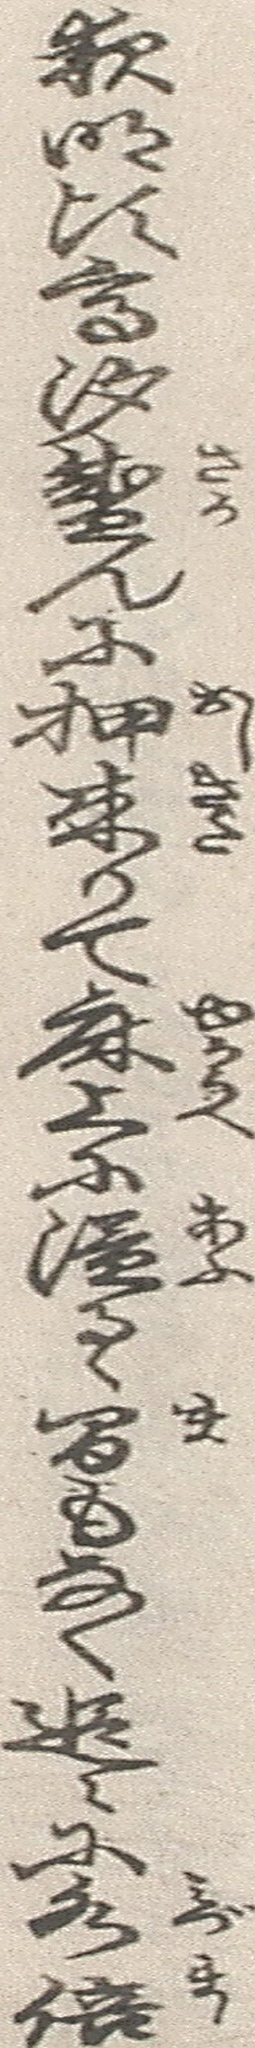夜明頃高汐盛んに押来りて床上に溢るゝ間もなく追々に水倍
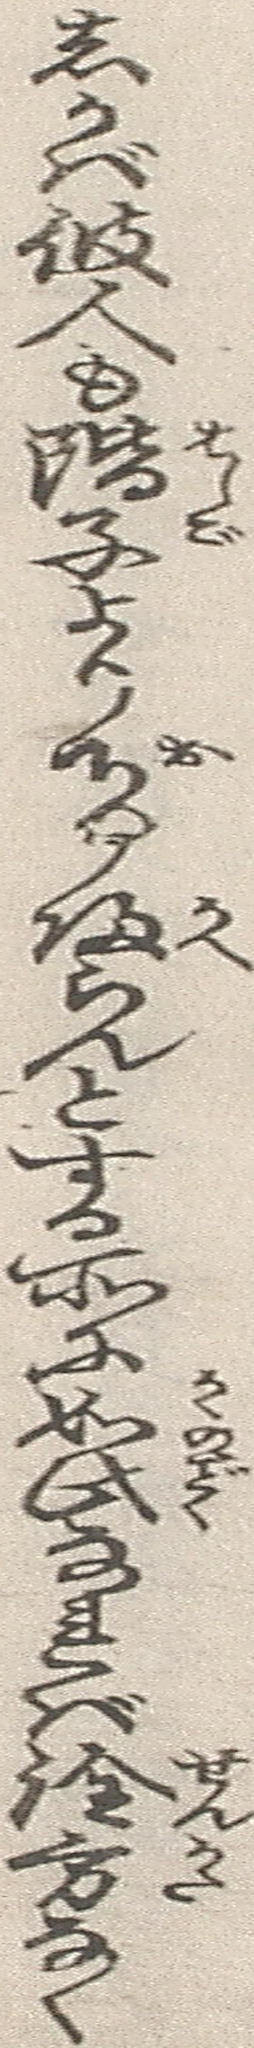しかバ彼人も階子より下り帰らんとする所に如此なれバ詮方なく
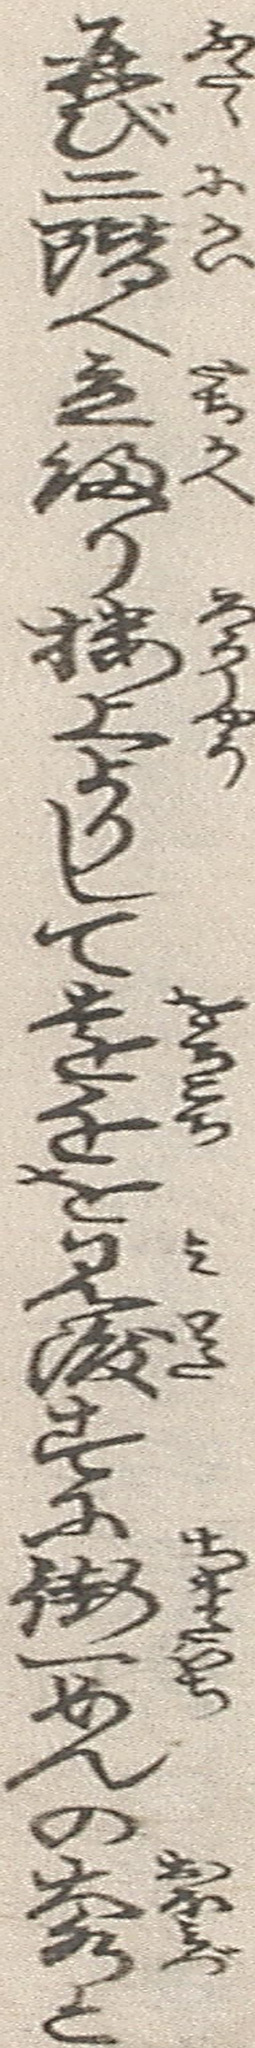再び二階へ立帰り楼上よりして遠近を見渡すに街一めんの大水と
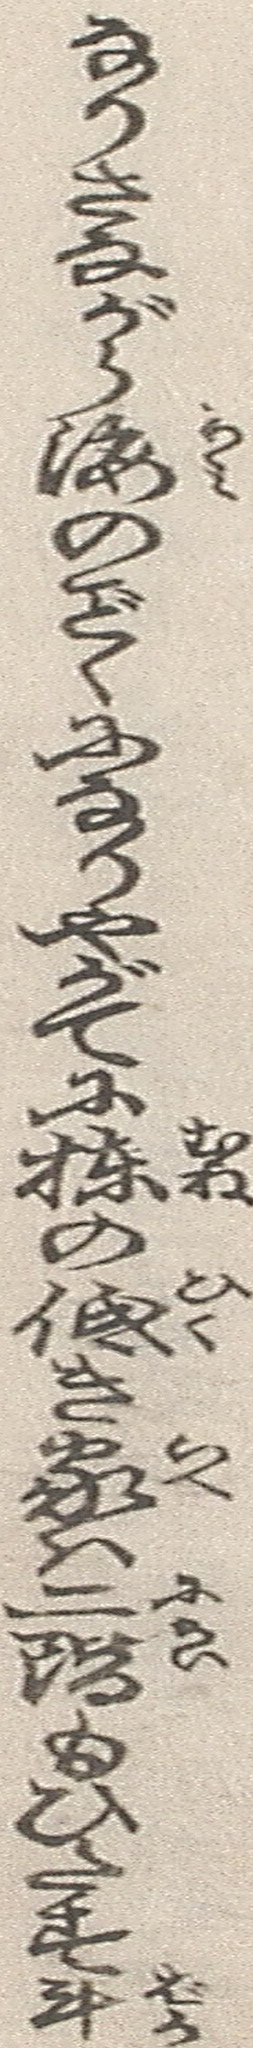なりさながら海のごとくなりやがてに棟の低き家ハ二階もひたす斗
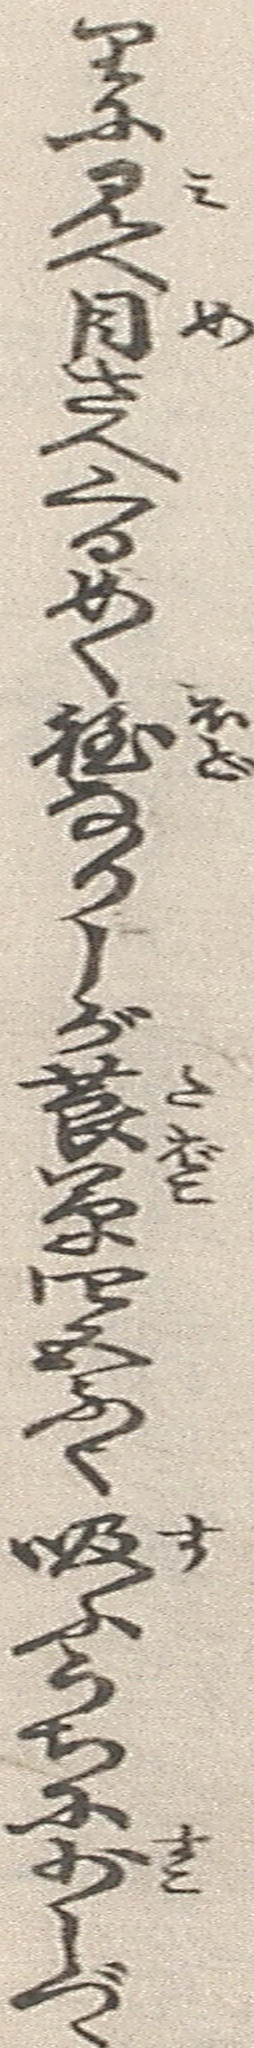りに見へ目さへくるめく程なりしが莨草四五ふく吸ふうちに少しづゝ
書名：安政風聞集　上中下　全
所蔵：東京大学地震研究所図書室 Earthquake Research Institute Library, The University of Tokyo, JAPAN
